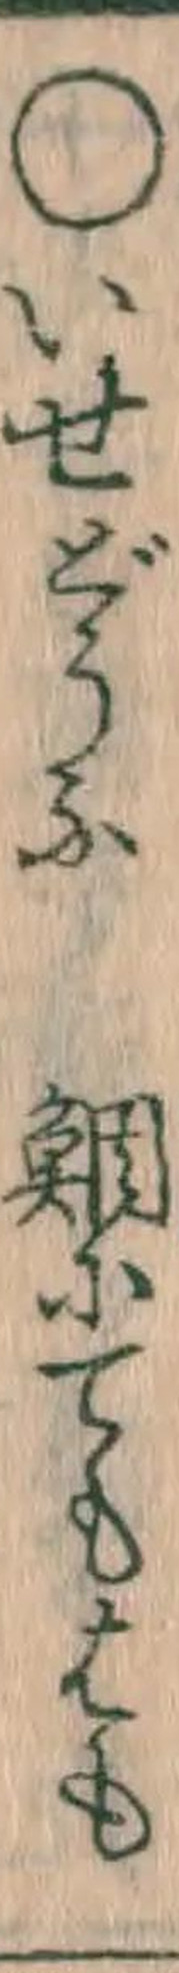○いせどうふ鯛にてもはも
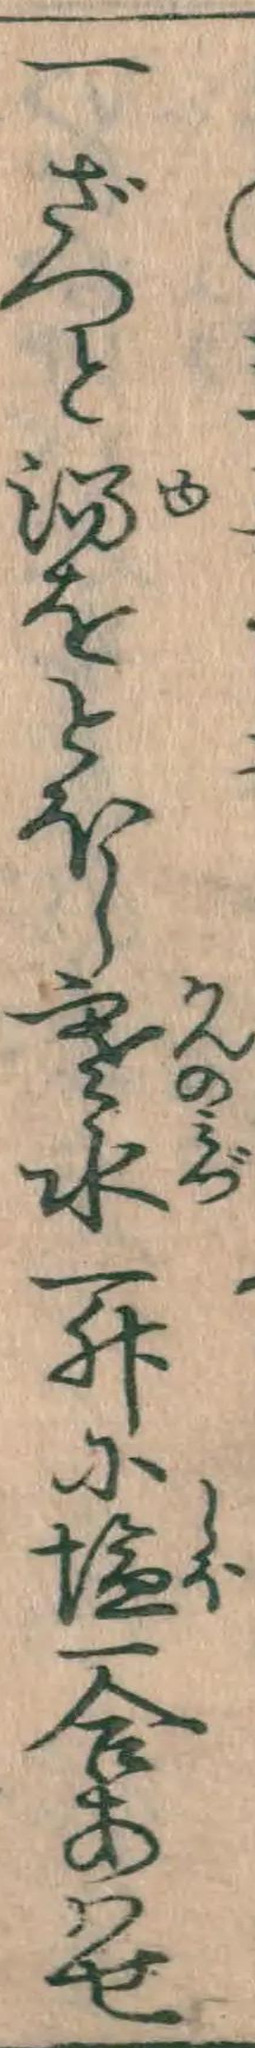一ざつと湯をとほし寒水一升に塩一合あはせ
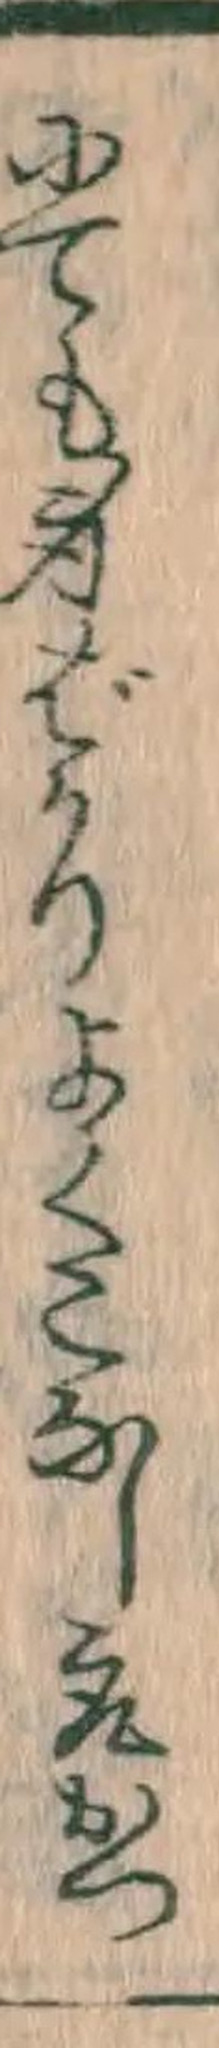にても身ばかりよくこなし取かつ
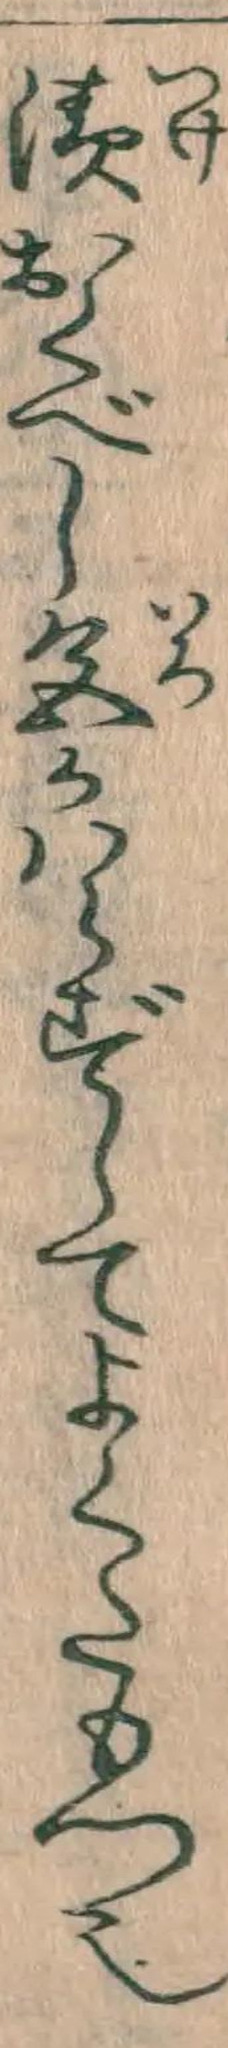漬おくべし色かはらずしてよくたもつ也
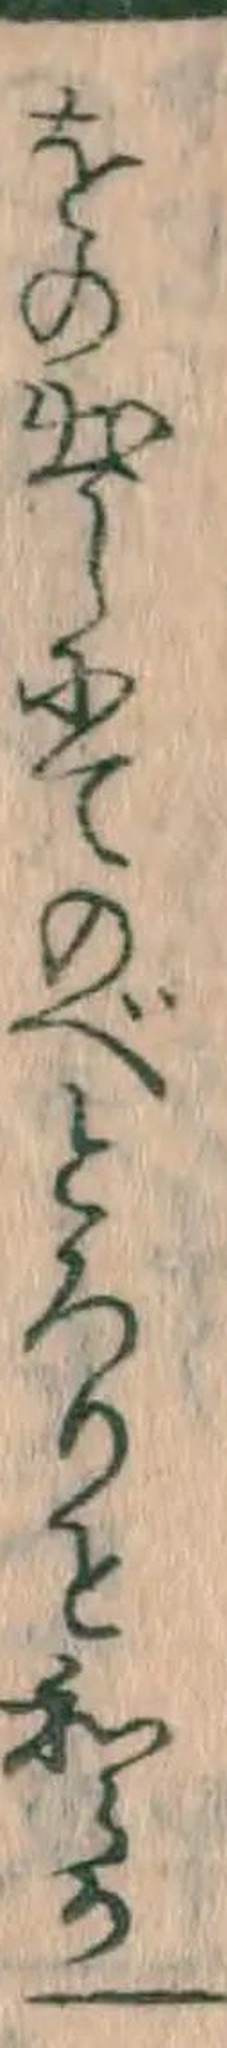をの出しにてのべとろりと和らか
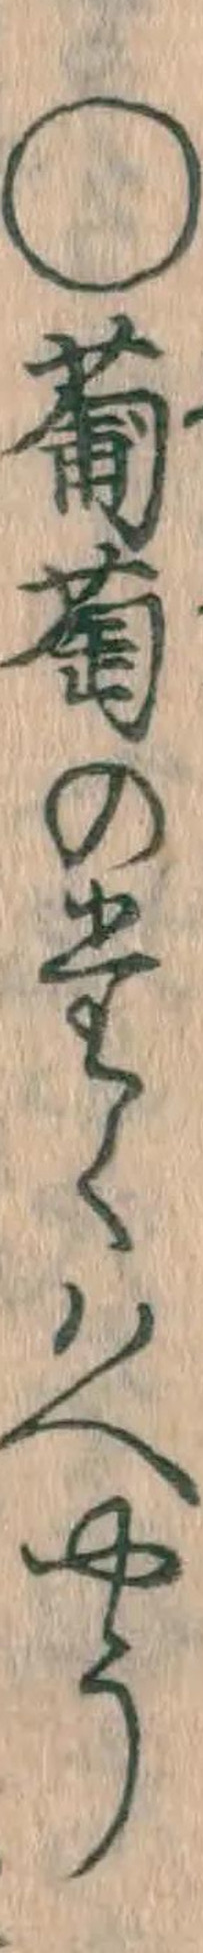○葡萄のたくはへやう
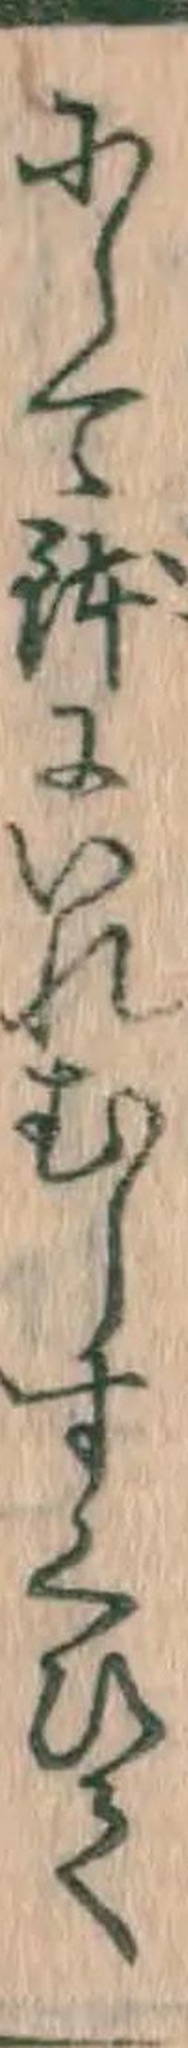にして鉢にいれむしすくひて
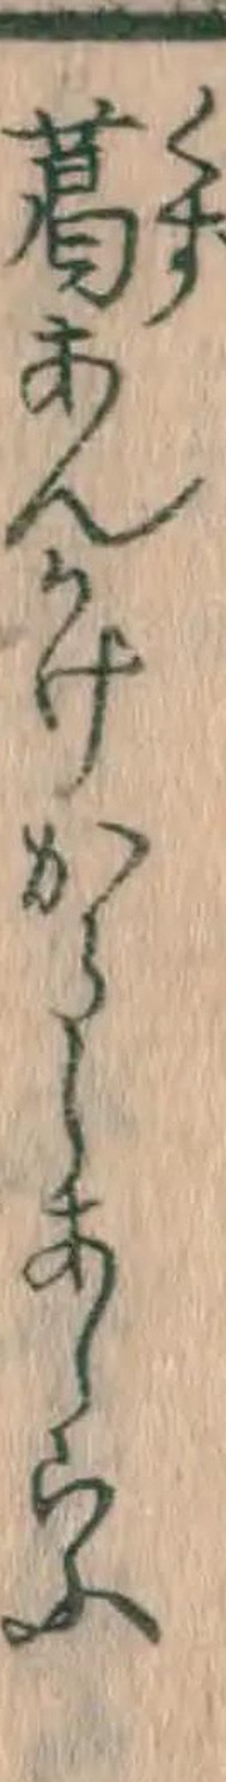葛あんかけからしあしらふ
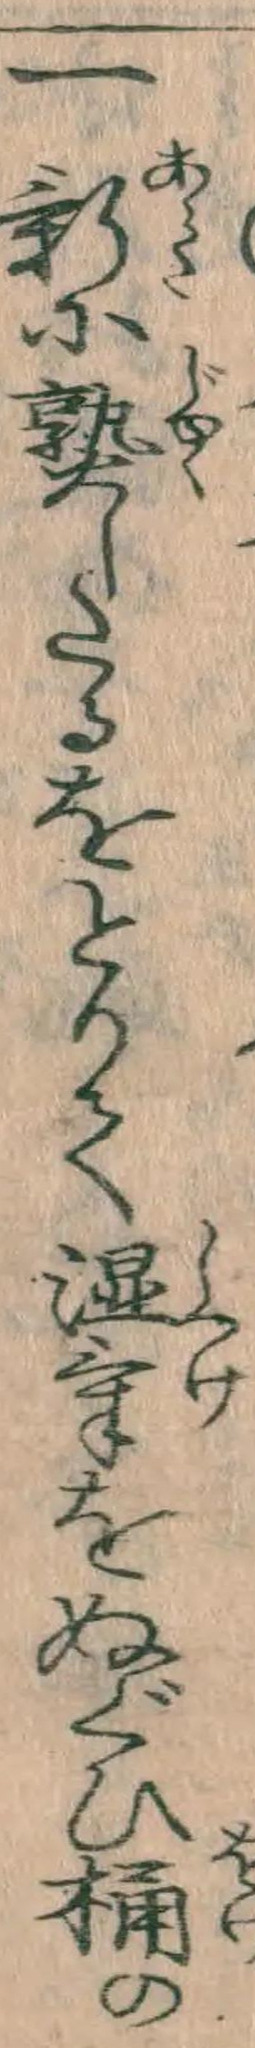一新に熟したるをとりて湿気をぬぐひ桶の
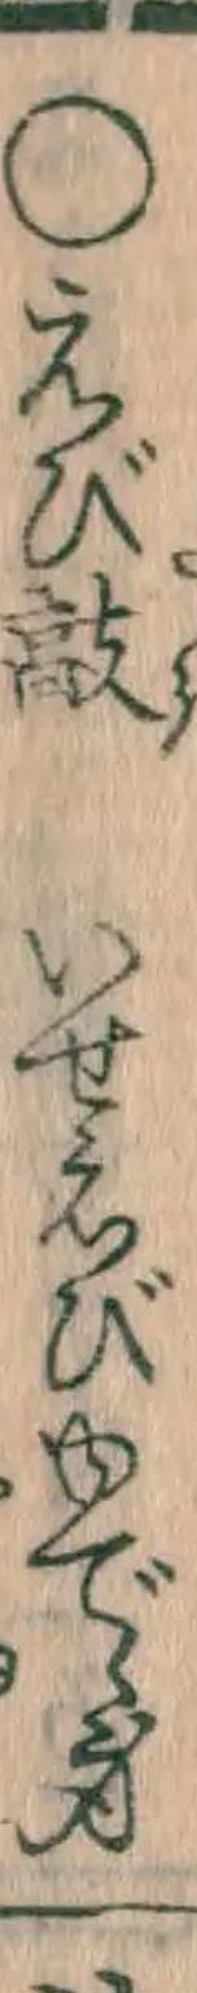○えび敲いせえびゆでゝ身
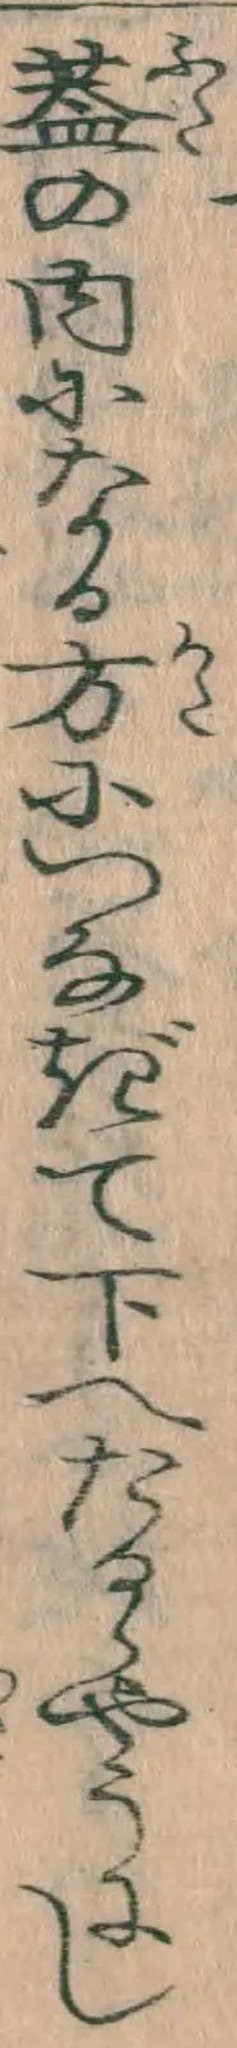蓋の内になる方につなぎて下へたるゝやうにし
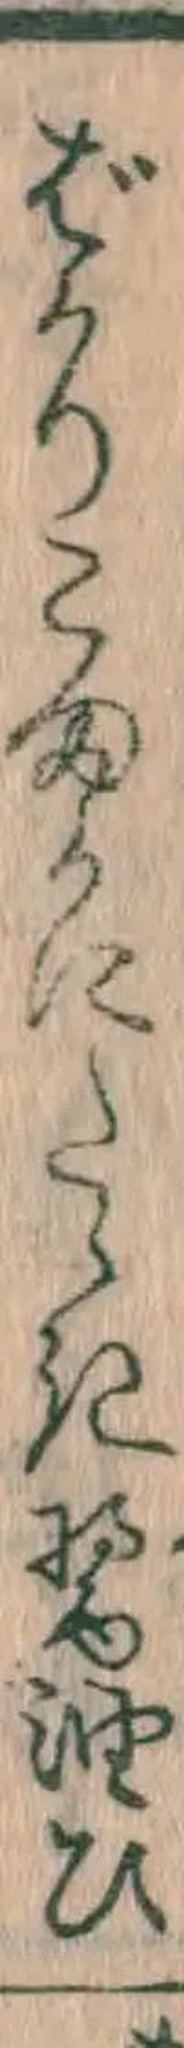ばかりこまかにたゝき醬油ひ
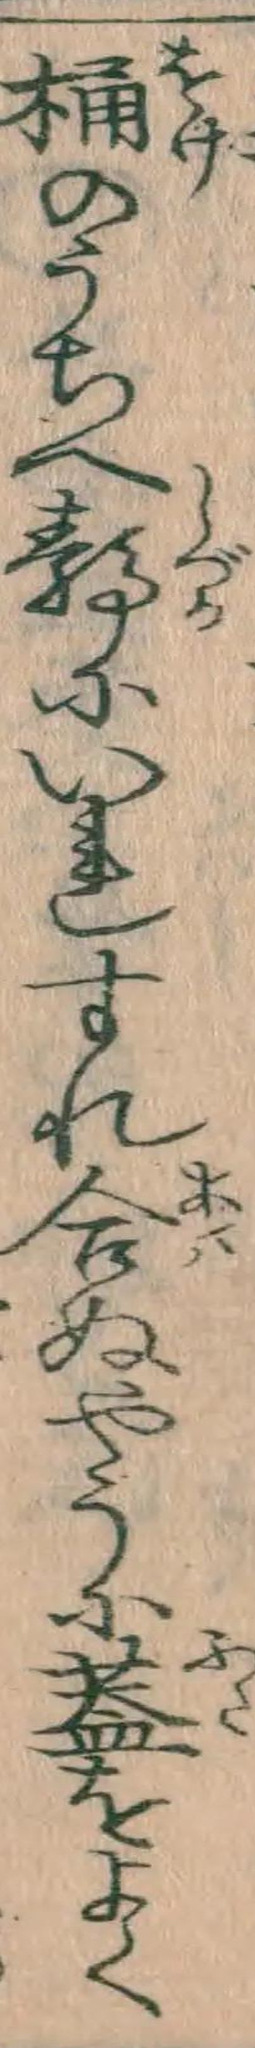桶のうちへ静にいれすれ合ぬやうに蓋をよく
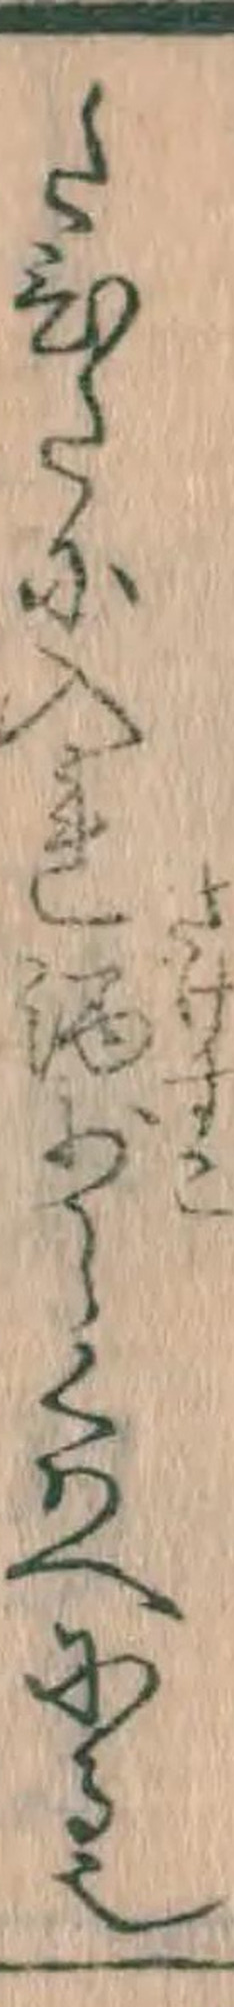たひたに入れ酒少しくはへにる也
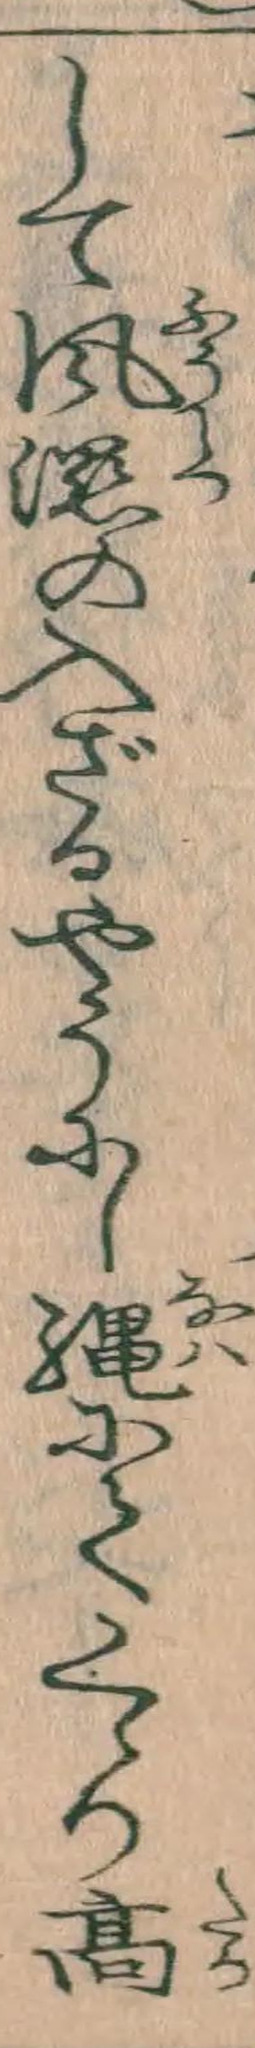して風湿の入ざるやうにし縄にてくゝり高
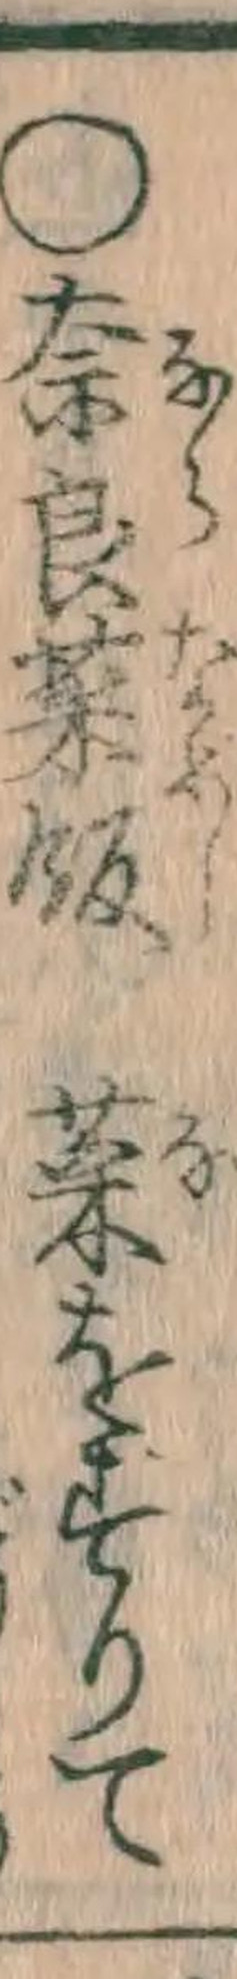○奈良菜飯菜をすりて
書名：広益秘事大全 3巻. [5]
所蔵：国立国会図書館 National Diet Library, JAPAN
